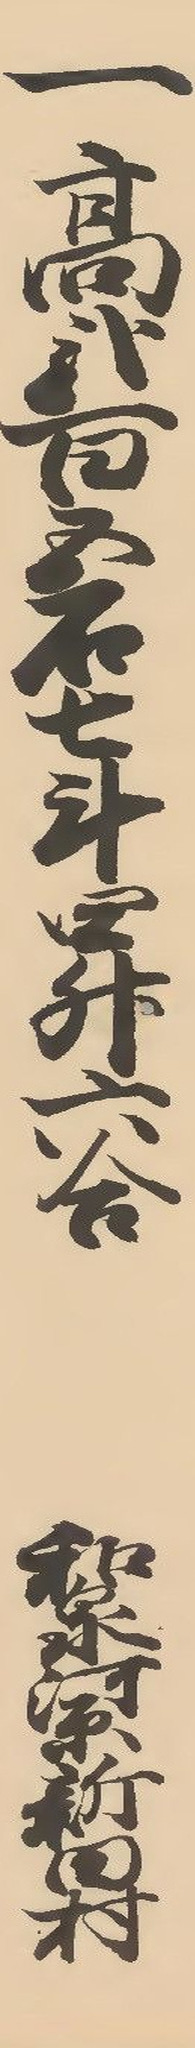一高弐百五石七斗四升六合和泉河原新田村
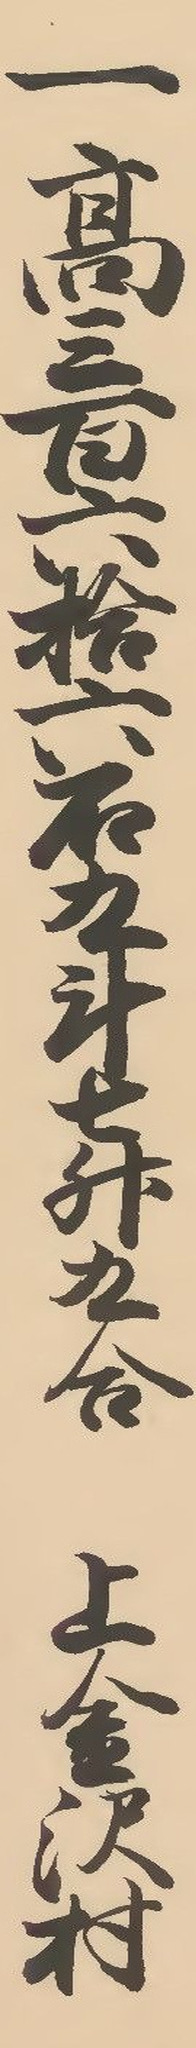一高三百六拾六石九斗七升九合上金沢村
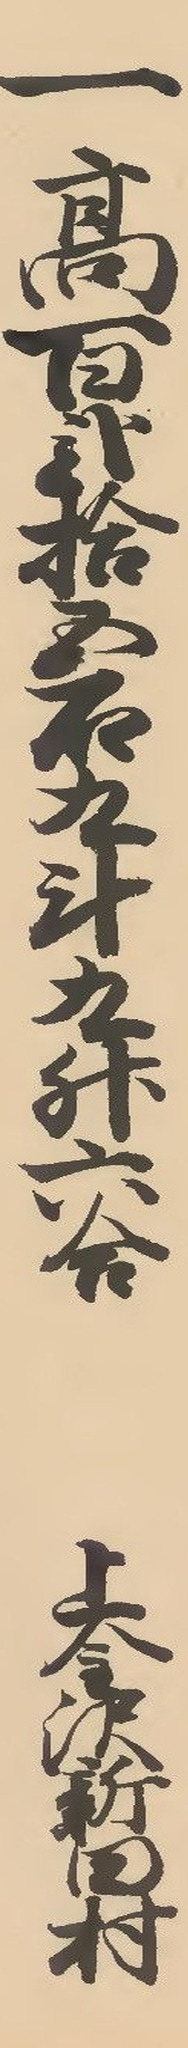一高百弐拾五石九斗九升六合上金沢新田村
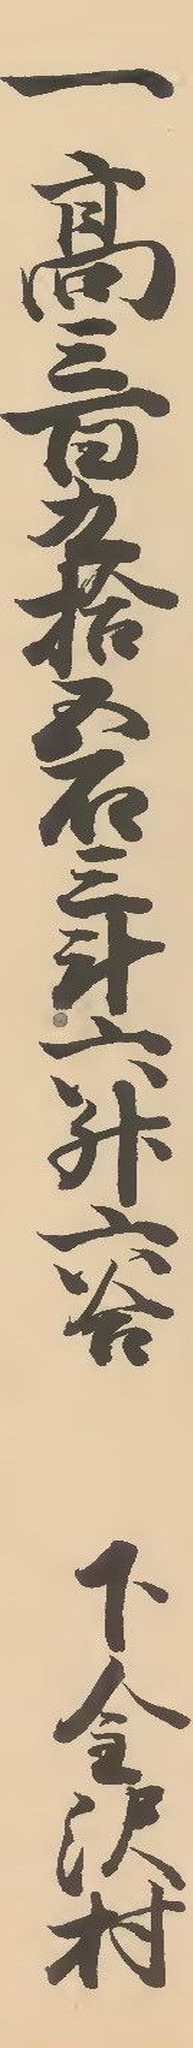一高三百九拾五石三斗六升六合下金沢村
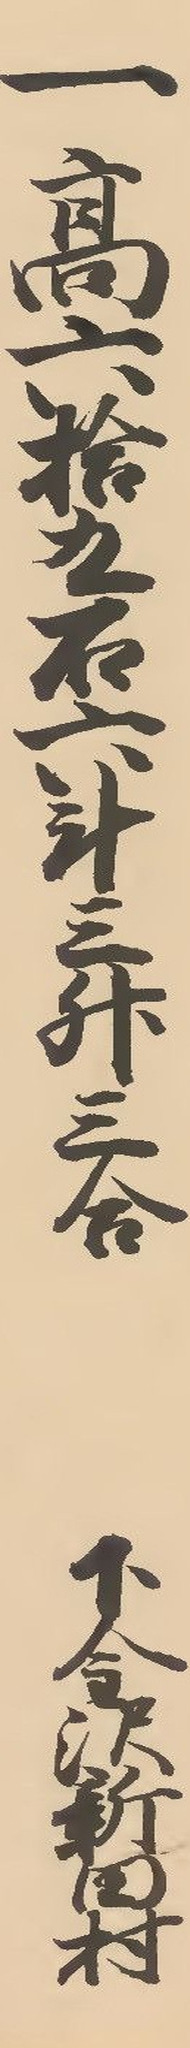一高六拾九石六斗三升三合下金沢新田村
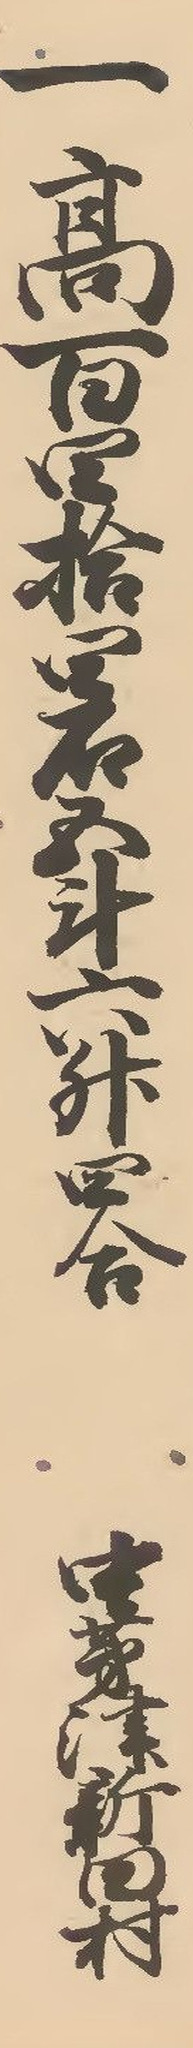一高百四拾四石五斗六升四合中茅津新田村

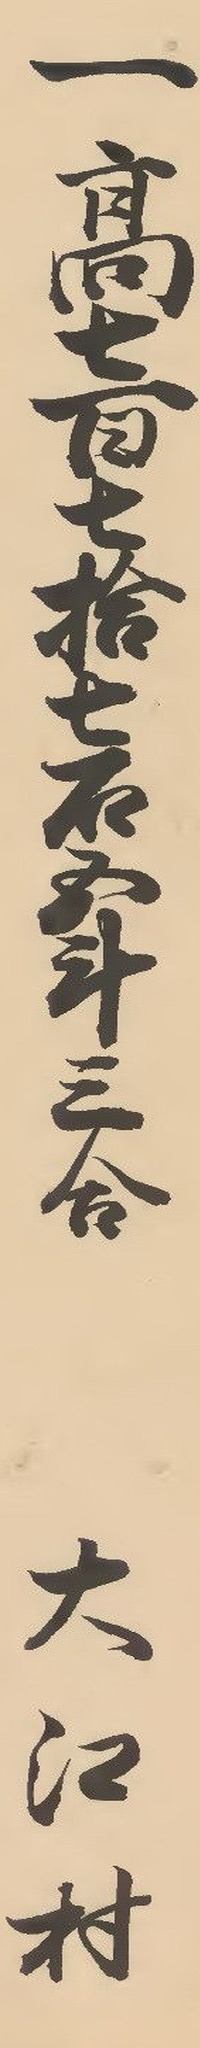一高七百七拾七石五斗三合大江村
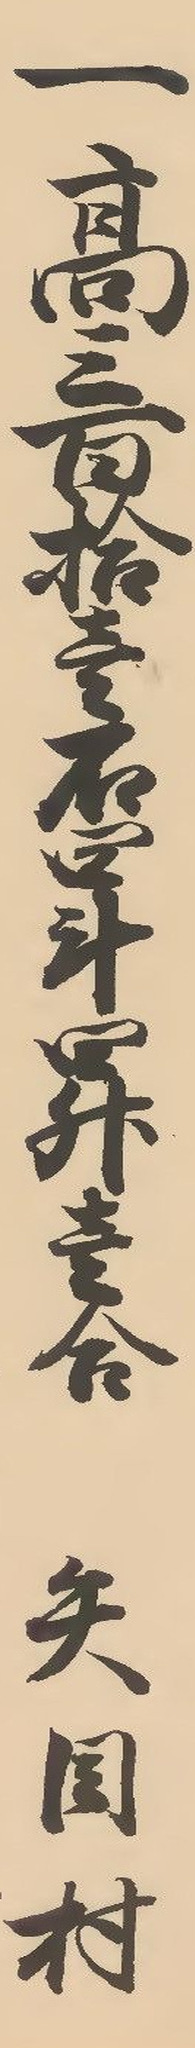一高三百拾壱石四斗四升壱合矢目村
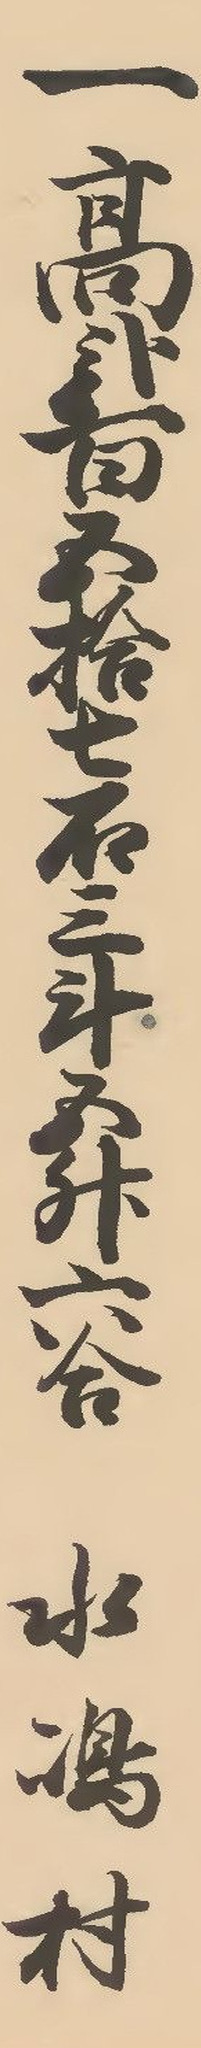一高弐百五拾七石三斗五升六合水島村
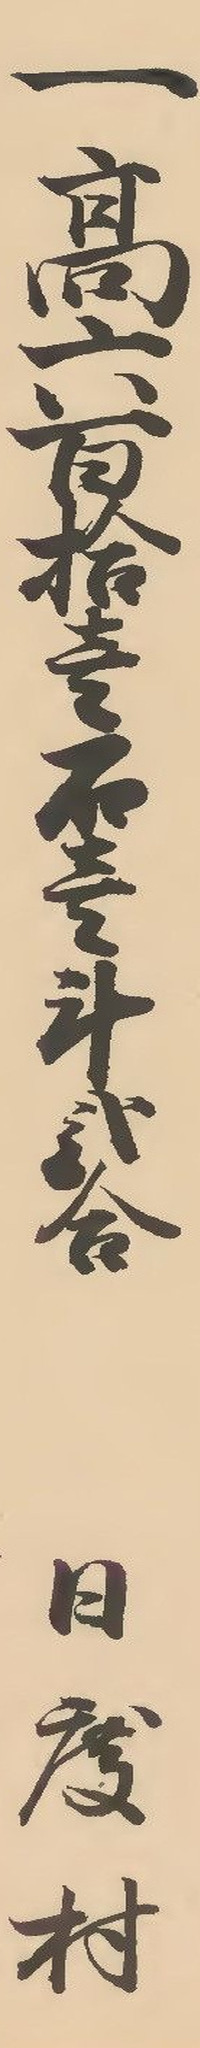一高六百拾壱石壱斗弐合日度村
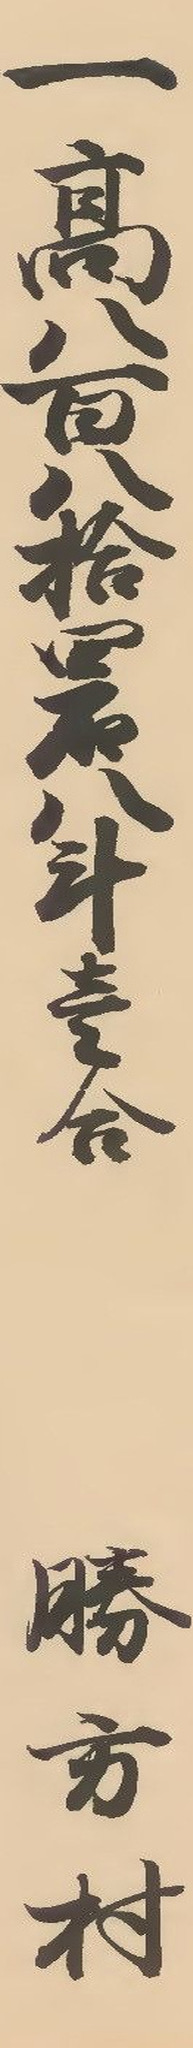一高八百八拾四石八斗壱合勝方村
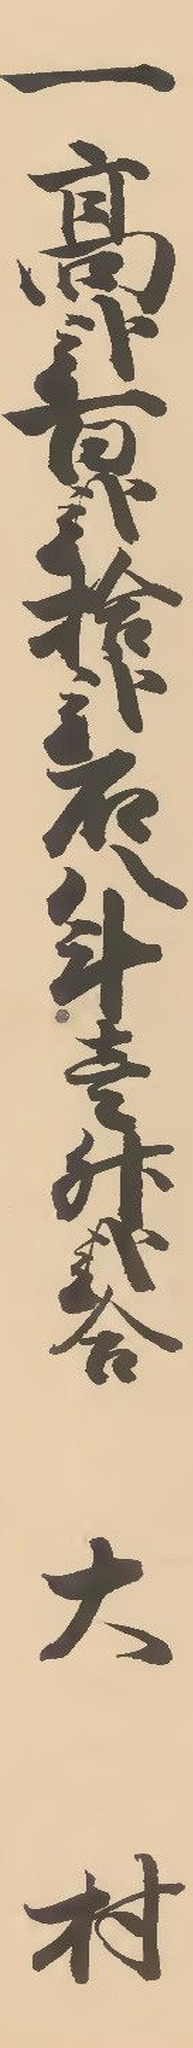一高弐百弐拾弐石八斗壱升弐合大村
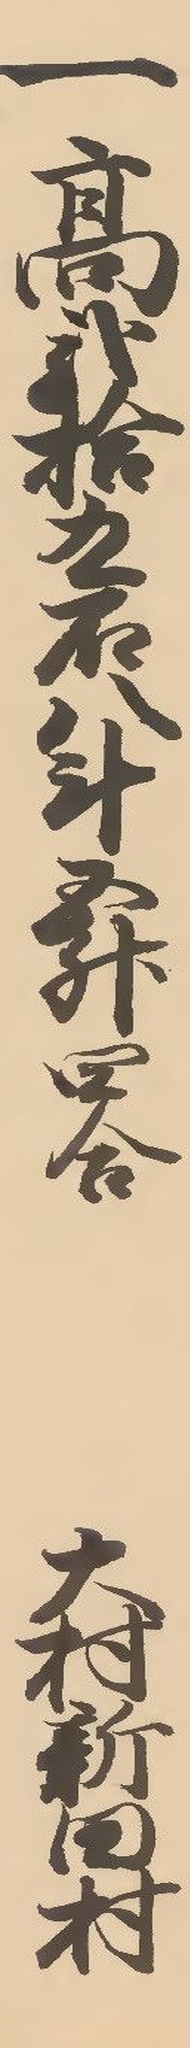一高弐拾九石八斗五升四合大村新田村
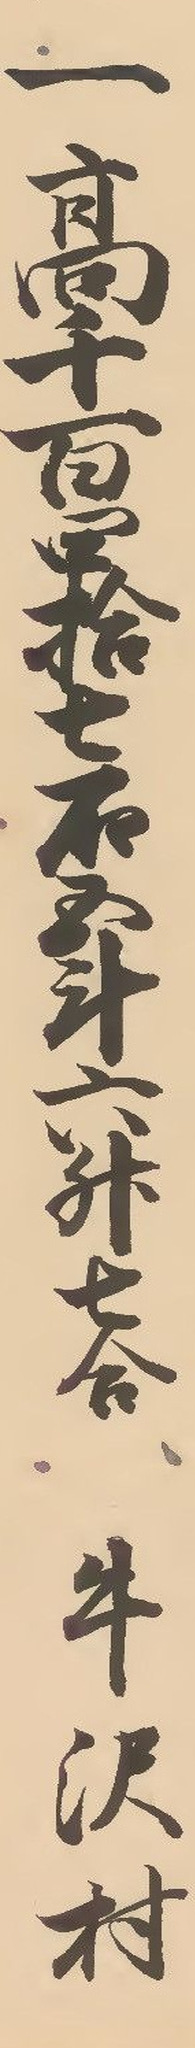一高千百四拾七石五斗六升七合牛沢村

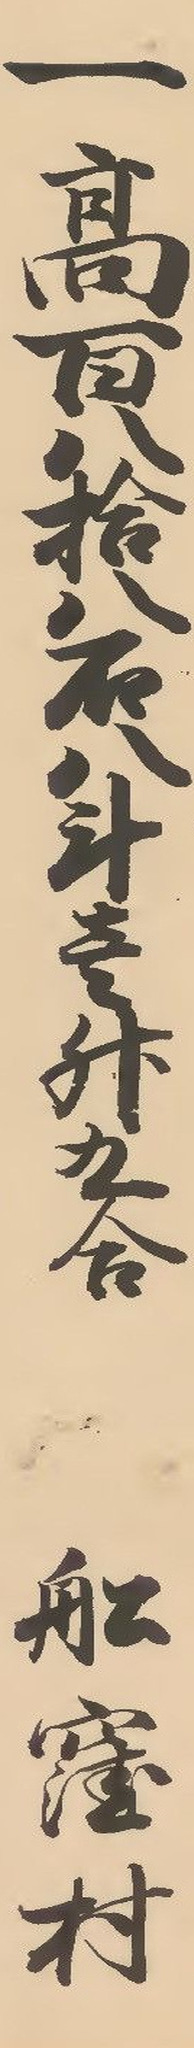一高百八拾八石八斗壱升九合船窪村
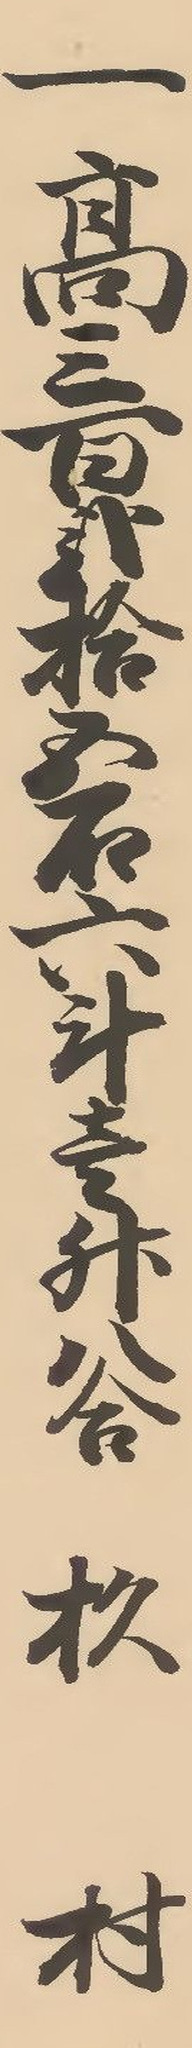一高三百弐拾五石六斗壱升八合杉村
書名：陸奥国郷帳　１
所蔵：国立公文書館 National Archives of Japan
